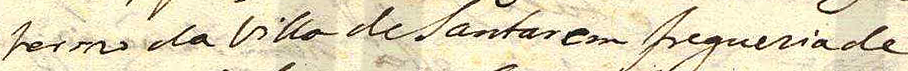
termo da villa de Santarem freguezia de
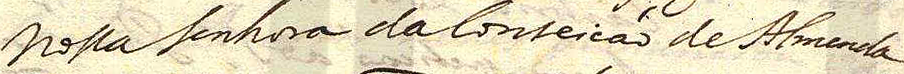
nossa Senhora da Conseicaõ de Almenda
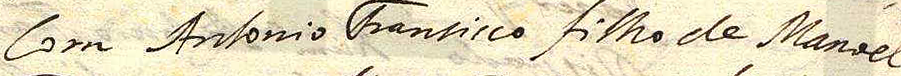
Com Antonio Francisco filho de Manoel
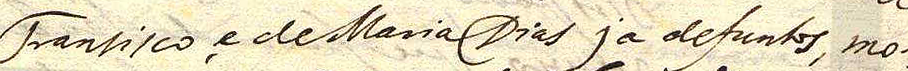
Francisco, e de Maria Dias ja defuntos, mo
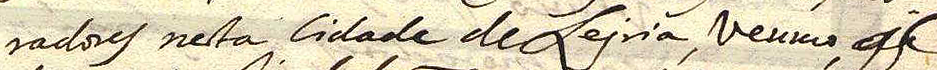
radores nesta Cidade de Lejria, veuuo, q̄
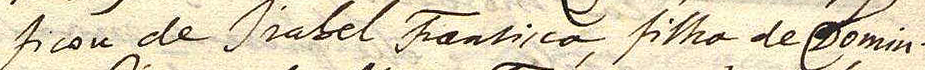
ficou de Izabel Francisca, filha de Domin
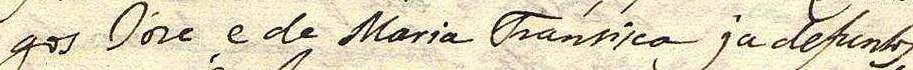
gos Ioze, e de Maria Francisca ja defuntos
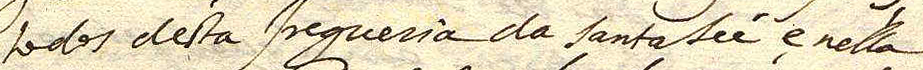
todos desta freguezia da santa seé, e nella
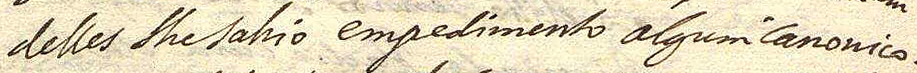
delles lhe sahio empedimento algum canonico.
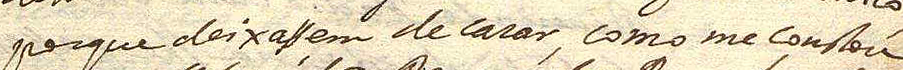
porque deixassem de cazar, como me constou
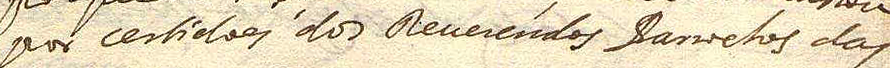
por certidoes dos Reuerendos Parrochos das
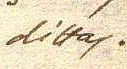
dittas.
